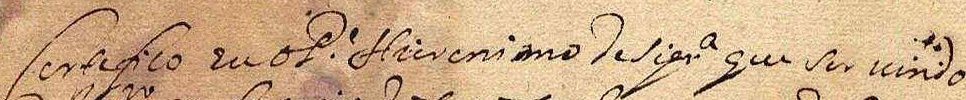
Certefico Eu o P.e Hieronimo de Siqra que seruindo
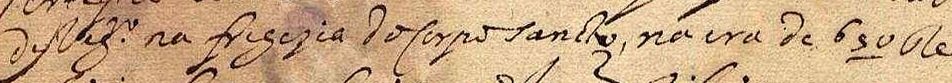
de Vig.ro na fregezia do Corpo sancto, na era de 650 Re
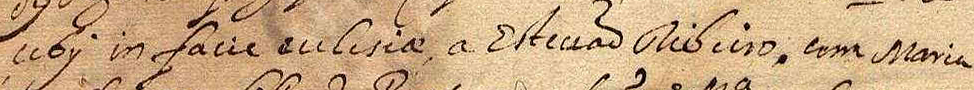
ceby in facie ecclesiæ, a Esteuaõ Ribeiro, com Maria
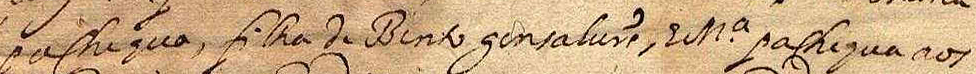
paChequa, filha de Bento gonsalurē, e M.a paChequa aos
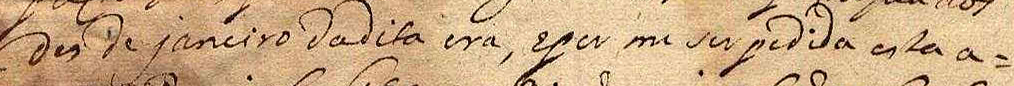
des de janeiro da dita era, E por me ser pedida esta a
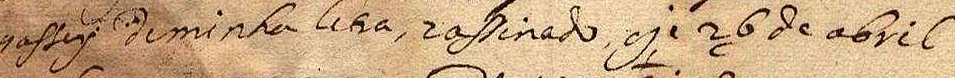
passey de minha letra, e assinado, oje 26 de abril
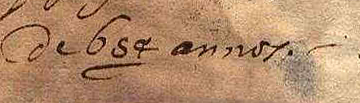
de 654 annos.
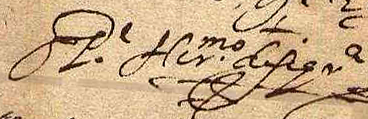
O P.e Her.mo de siqra
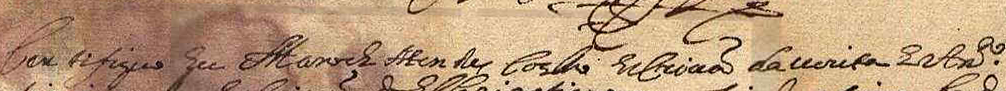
Certifiquo Eu Manoel Mendes Coelho EsCriuaõ da uezita E Anto.
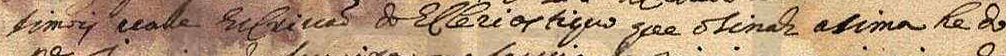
simois uale EsCriuaõ do ECleziastiquo que o sinal asima he do
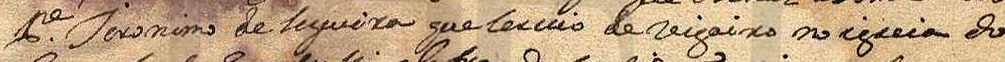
P.e Jeronimo de sequeira, que seruio de vigairo no igreia do
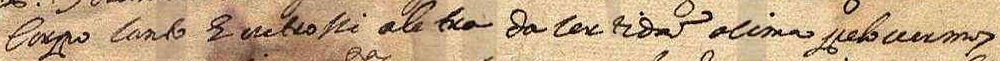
Corpo santo E outrossi a letra da sertidaõ asima pelo uermos
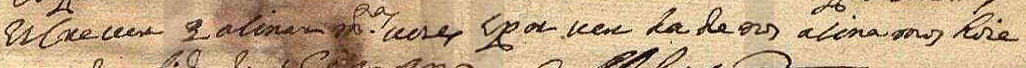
EsCreuer E asinar m.tas uezes E por uerdade nos asinamos hoie
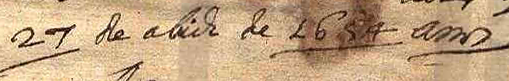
27 de abril de 1654 anos
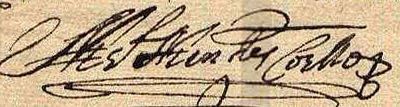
Mel Mendes Coelho
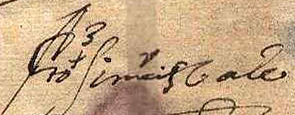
Ant̄ Simõis Vale
